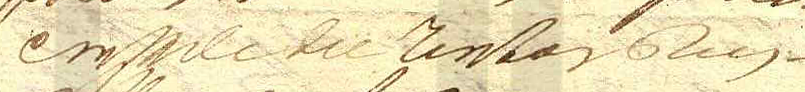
em mil e duzentos Reis
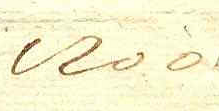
1200
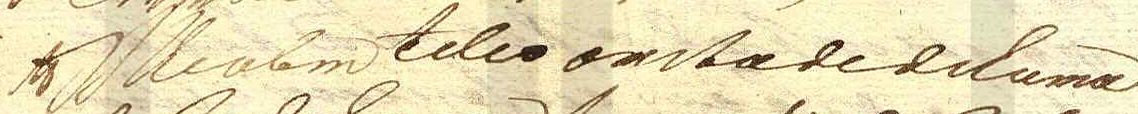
item lhe aComteCeo a metade huma
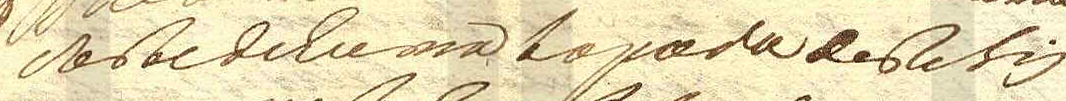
sorte de huma tapada de Ribej
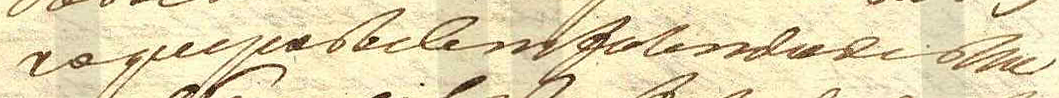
ro que parte Com fazenda de Ma
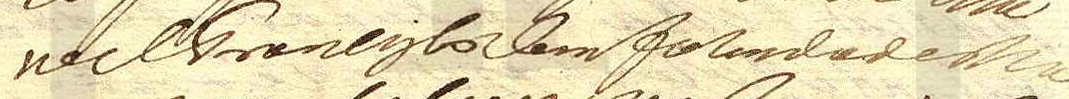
noel Francisco e Com fazenda de Ma
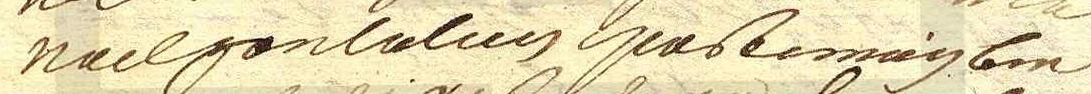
noel goncalues e parte mais Com
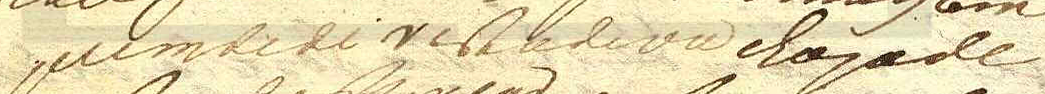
quem de direito deva e haja de
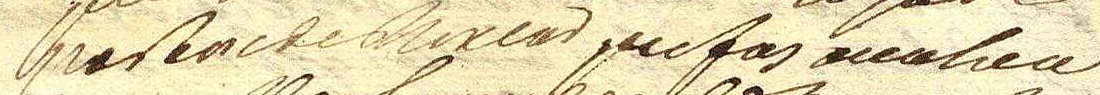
partir e deMarcar que foi aualua
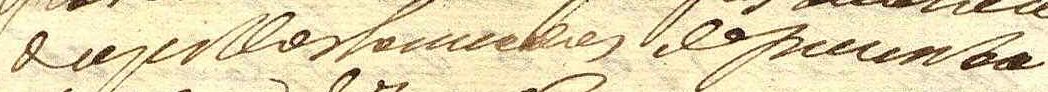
da pellos louuados do jnuenta
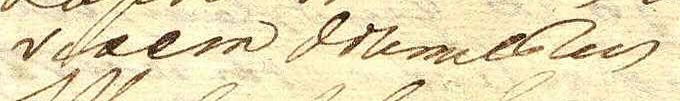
rio em doze mil Reis
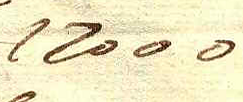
12000
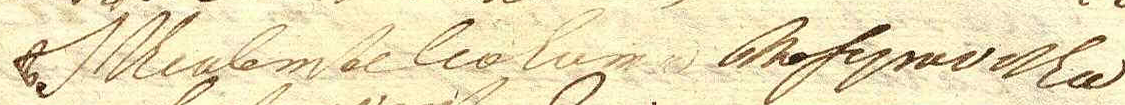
item lhe aComteCeo huma Moseyra velha
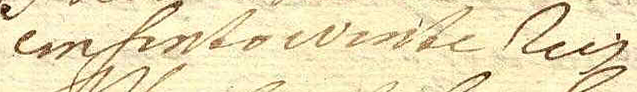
em sento e vinte Reis
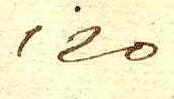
120
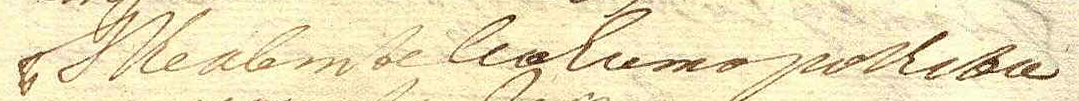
item lhe aComteCeo huma palheta
